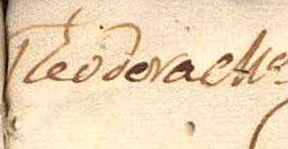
Theodora Ma.
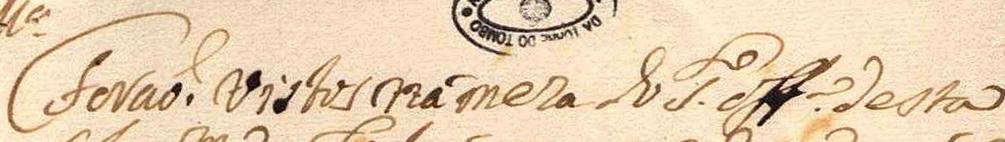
Foraõ vistos na meza do s.to offo. desta
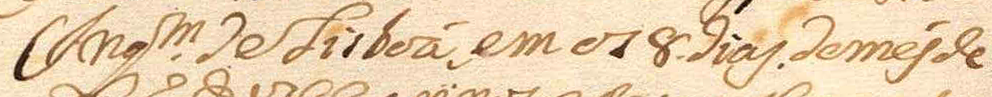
Inq.m de Lisboa, em os 8. dias. do més de
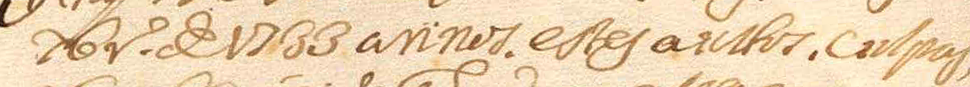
7br.o d̄ 1733 annos. estes auttos, culpas
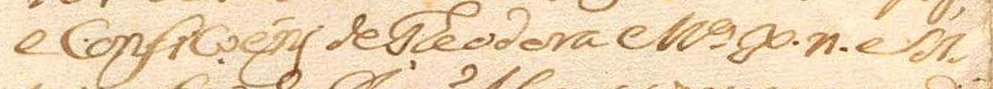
e Consiçoẽns de Theodora M.a x. n. sol
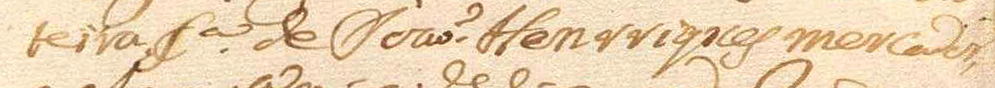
teira fa. de Ioaõ. Henrriques mercador,
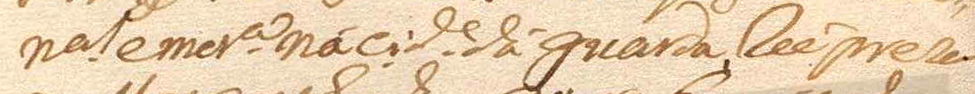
na.l e mora. na cid.e da Guarda, Ree preza
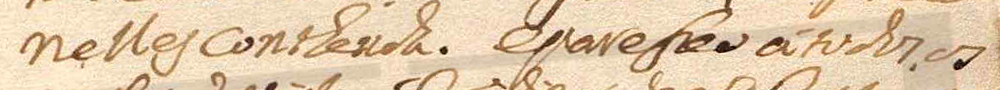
nelles contheuda. E paresseo a todos os
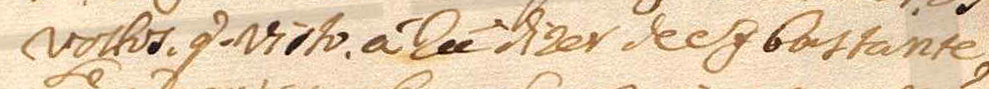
vottos, q̄ visto, á Ree dizer de sy bastante
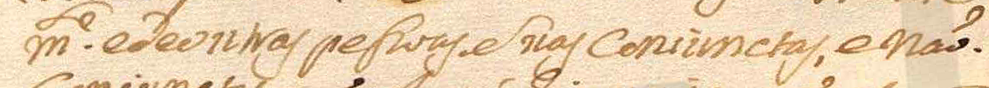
m.te e de outras pessoas suas coniunctas, e naõ
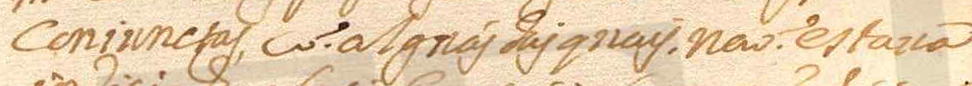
coniuctas, cō alguās dis quais. naõ. estaua
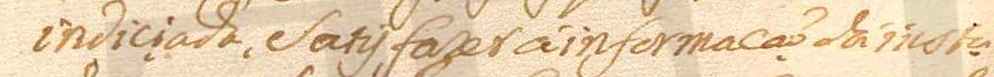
indiciada, e satisfazer á informaçaõ dá insta
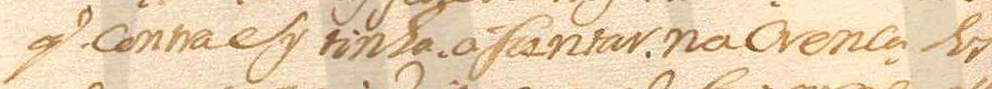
q̄ contra sy tinha. asuntar. na Crença dos
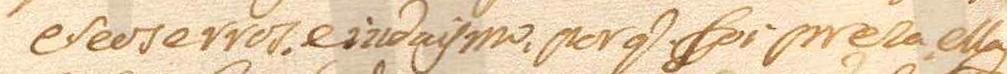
e seos erros. e iudaismo, porq̄ foi preza ella
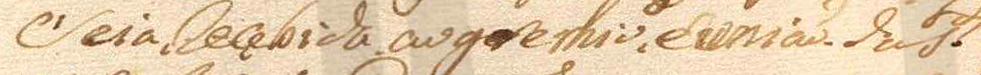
seia Recebida ao gremio. E uniaõ da s.ta
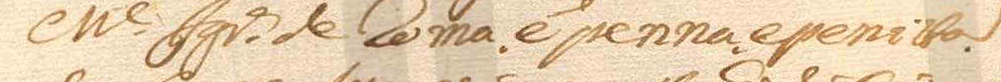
Me. Jgr.a de Roma. e penna, e penitta.
